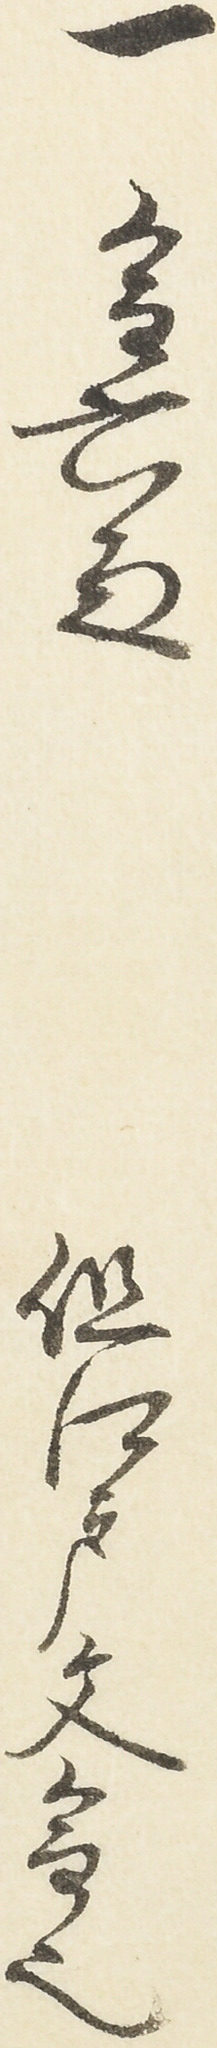一金六両但江戸文金也
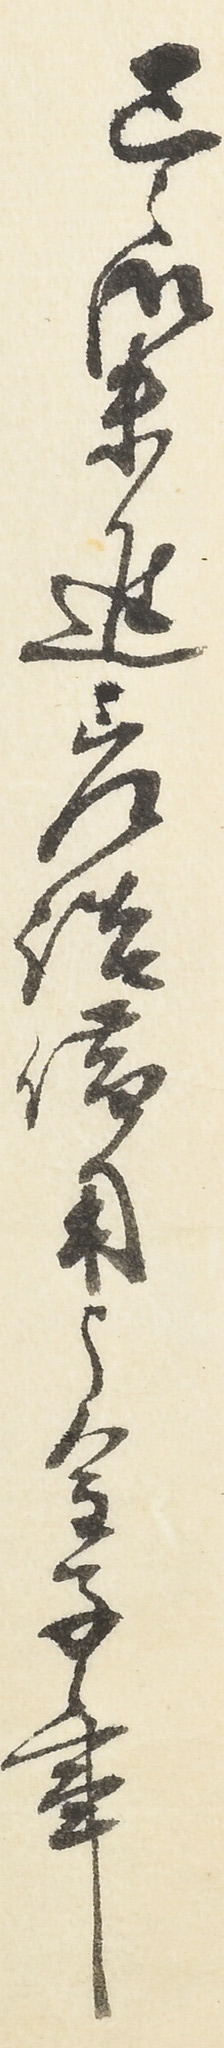巳之御未進差詰借用申金子之事
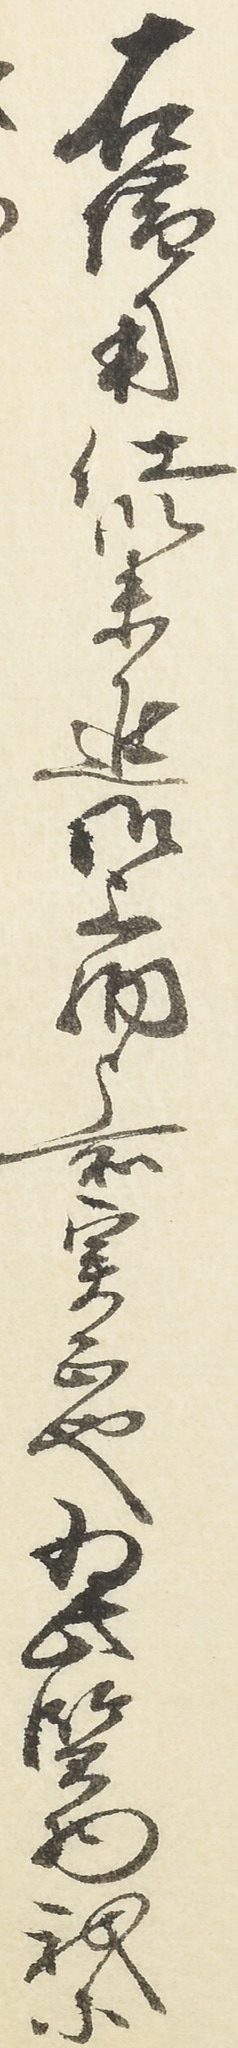右借用仕御未進御上納申所実正也為此質物我等
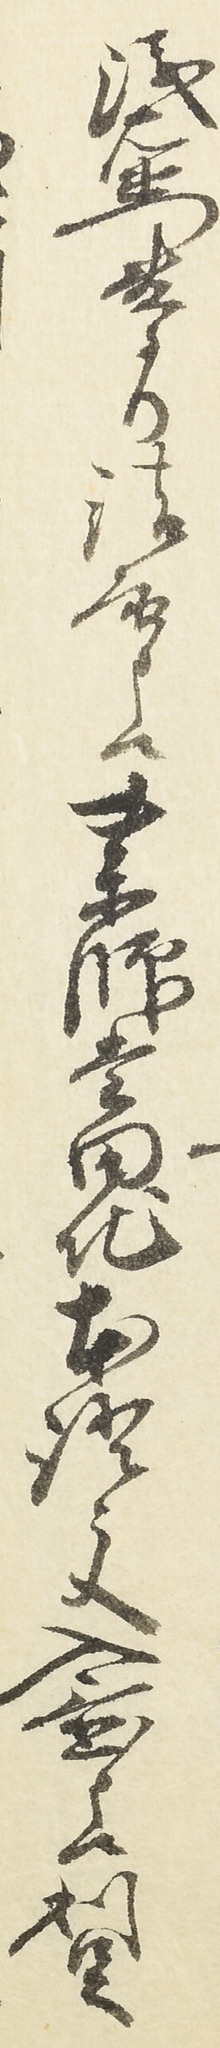浅右衛門殿より請取申候薬師堂田地本証文入置申候利足
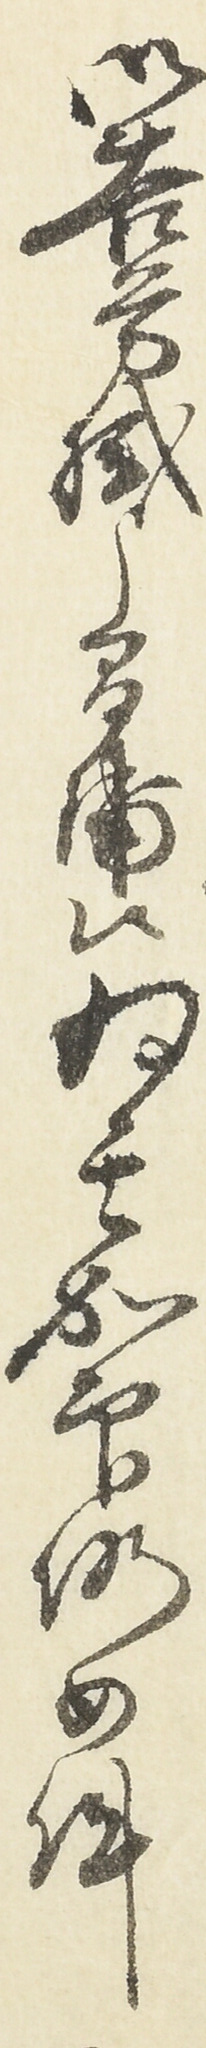御苦労掛申間鋪候為其加印仍如件
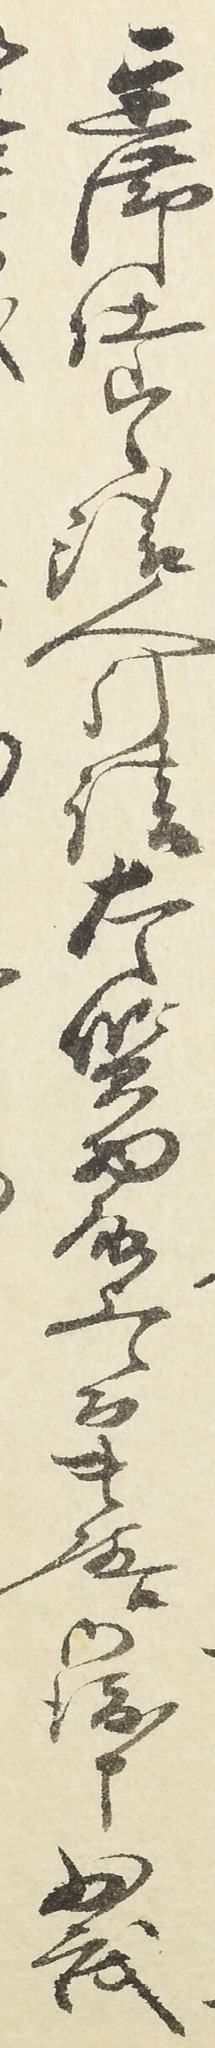遅滞仕候ハゝ請人引請右之質物取上候而貴殿江御渡申少
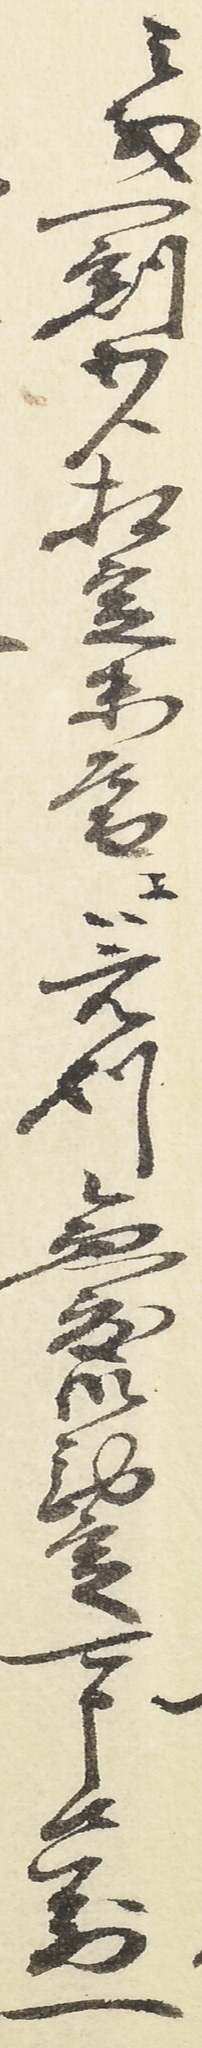之義一割五分相定未暮ニハ元利急度御勘定可申候万一
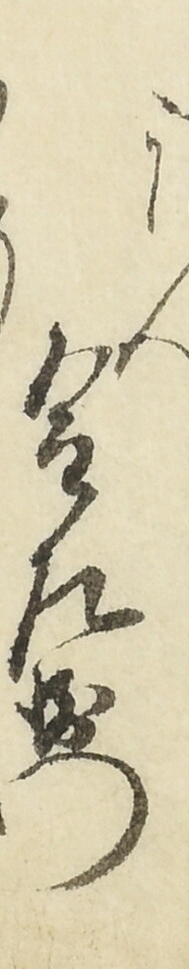兵左衛門
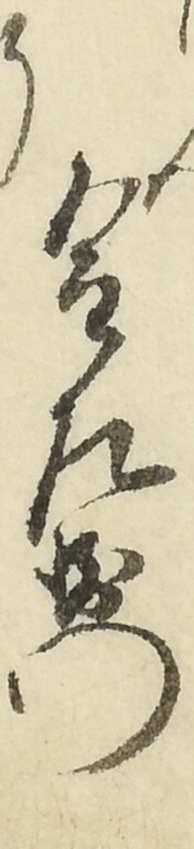兵左衛門
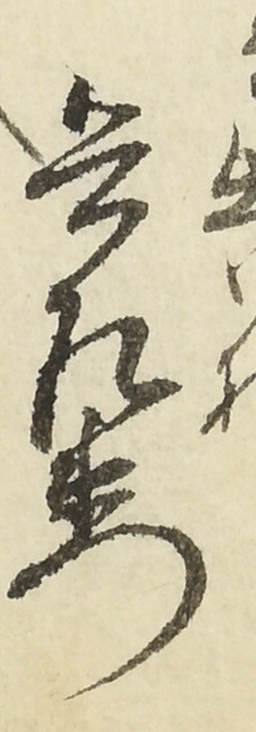兵左衛門
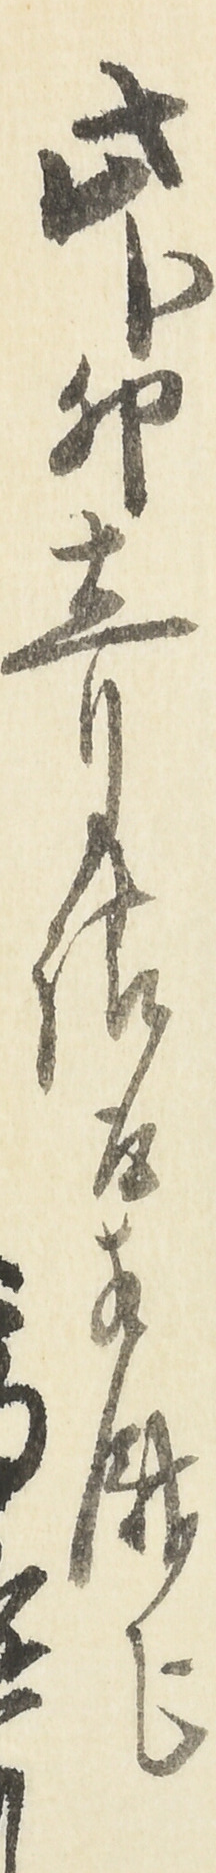此分卯十二月請取相済申候
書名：諸証文書写帳
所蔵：伊那市立高遠町図書館・合同会社AMANE
